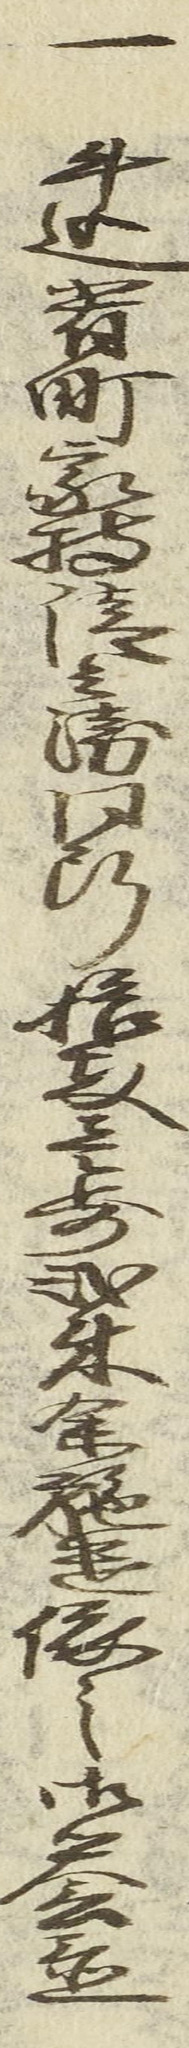一牛込肴町家持清兵衛同断拾両壱歩弐朱余施遣依之御誉置
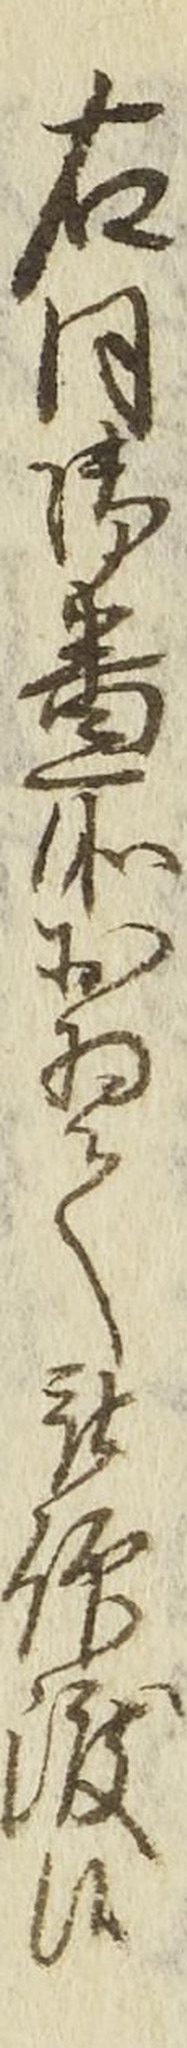右同御番所おゐて被仰渡候

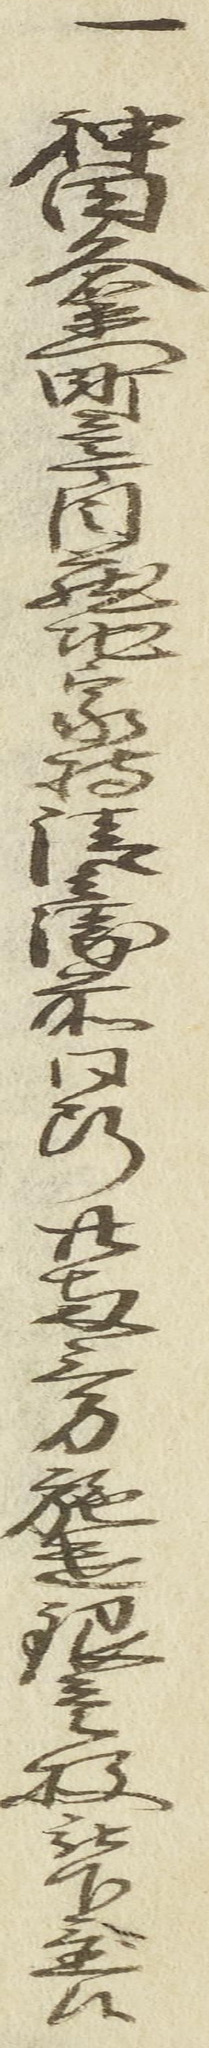一神田久右衛門町壱丁目蔵地家持清兵衛前同断廿両三分施遣銀壱枚被下置候
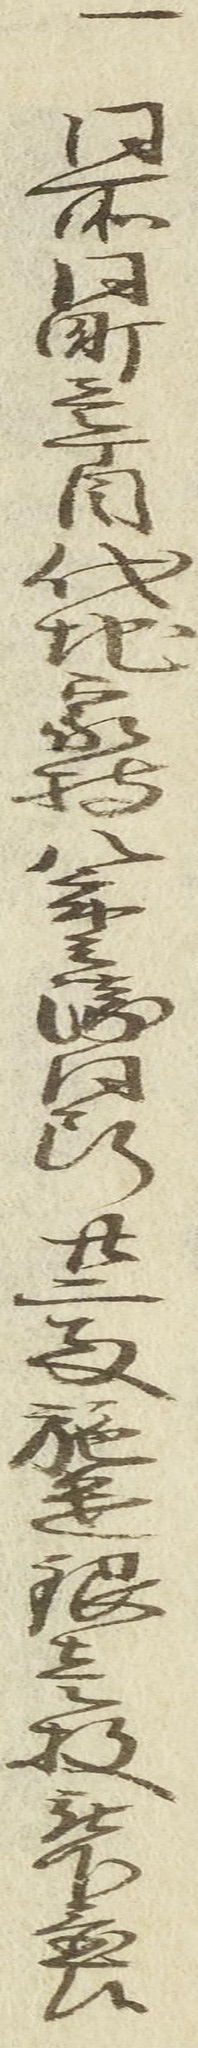一同所同町壱丁目代地家持八郎兵衛同断廿二両施遣銀壱枚被下置候
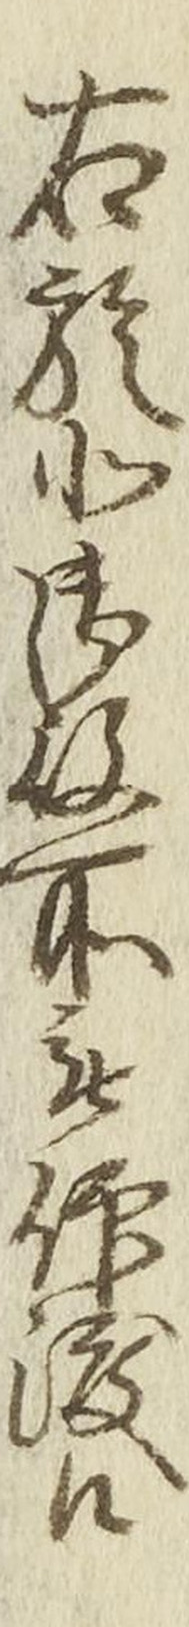右於北御役所被仰渡候
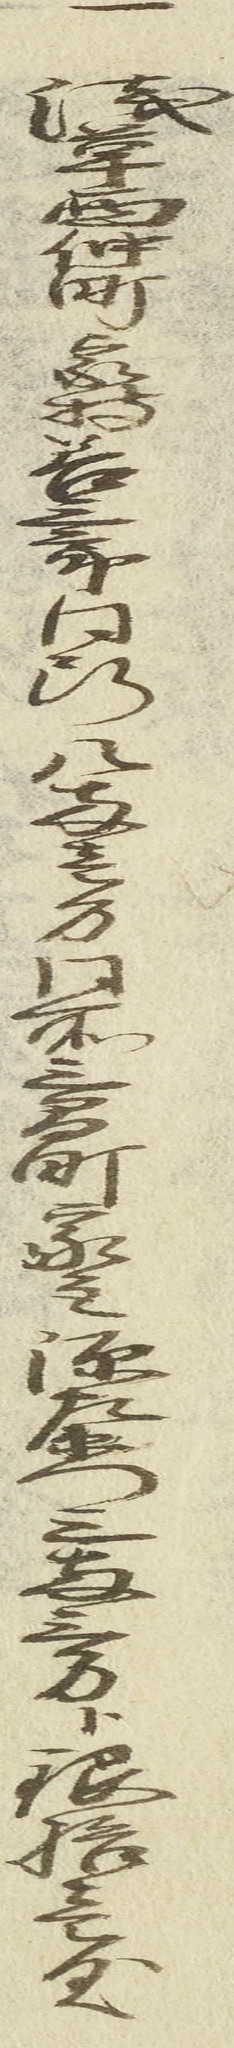一浅草西仲町家持善三郎同断八両壱分同所三間町家主源左衛門三両三分ト銀拾壱匁
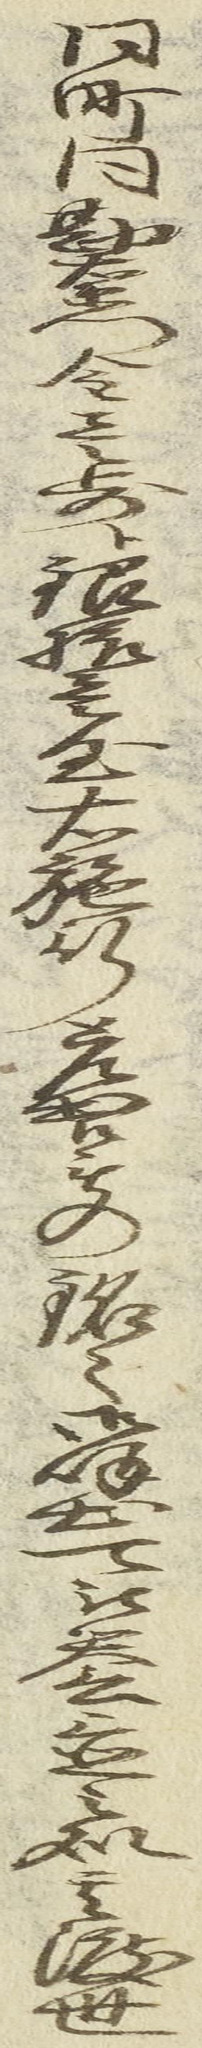同町同勘右衛門金壱歩ト銀拾壱匁右施行差出候もの銘々御呼出可被誉置之処其渡世
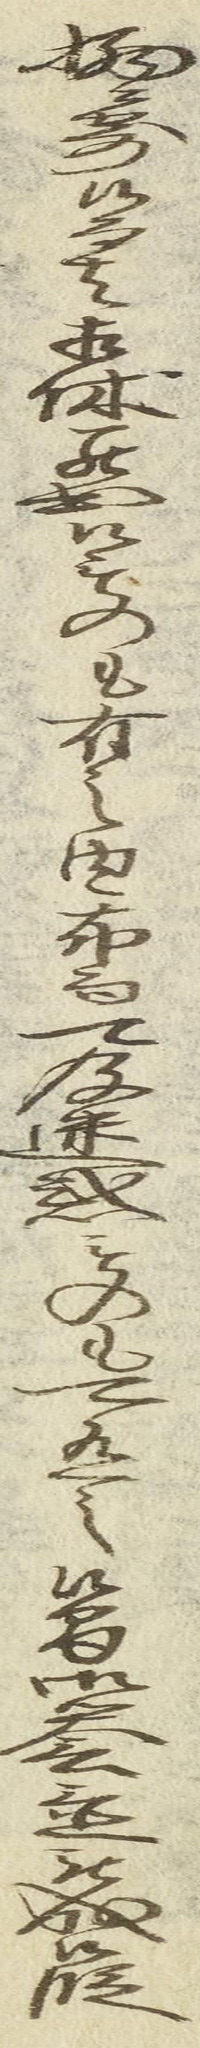柄ニ寄候而者相休罷出候ものも有之由却而可及迷惑ものも可有之候間御誉置被成候段
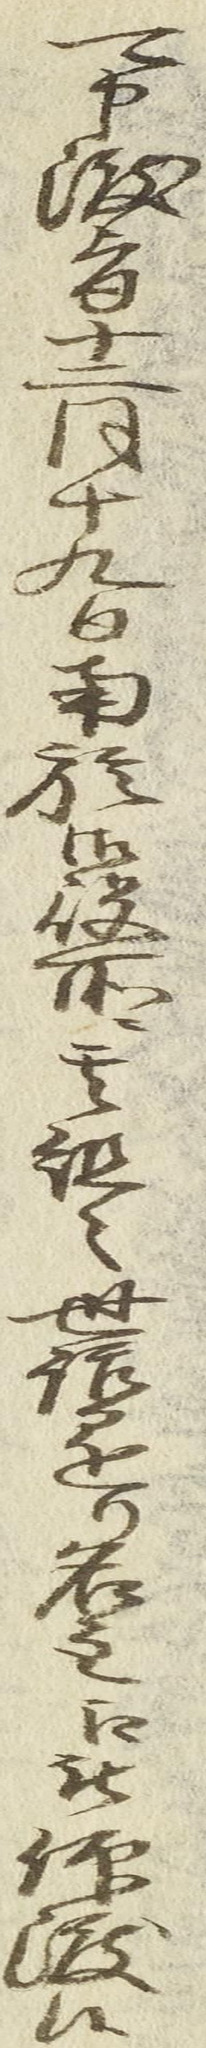可申渡旨十二月十九日南於御役所ニ其組々世話懸り名主江被仰渡候
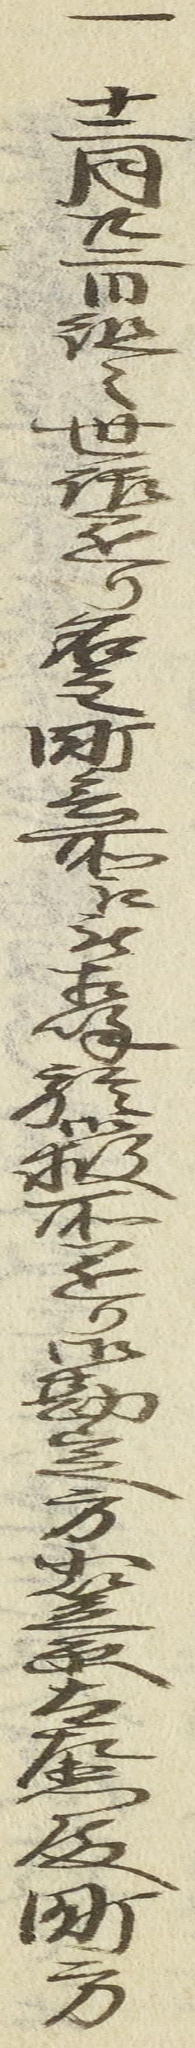一十二月廿ニ日組々世話懸り名主町会所江被相呼於御救所懸り御勘定方小笠原太左衛門殿町方
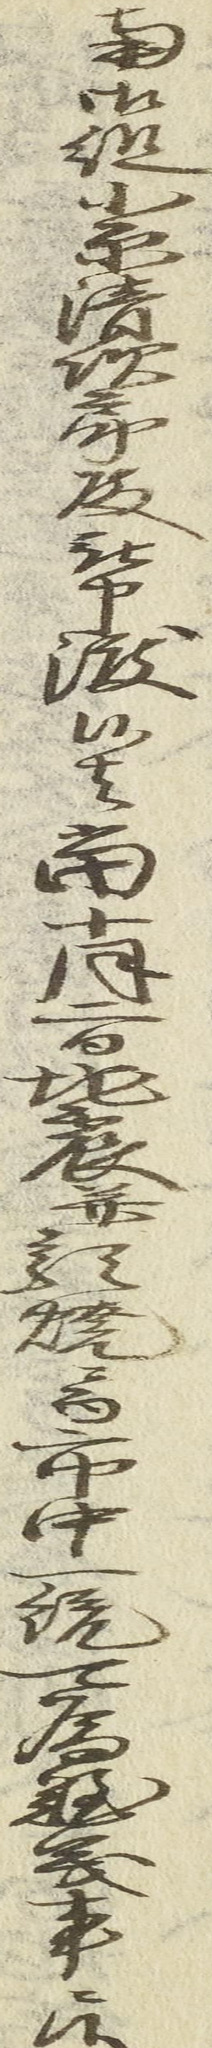南御組小原清次郎殿被申渡候者当十月二日地震幷類焼ニ而市中一統可為難義事ニ候
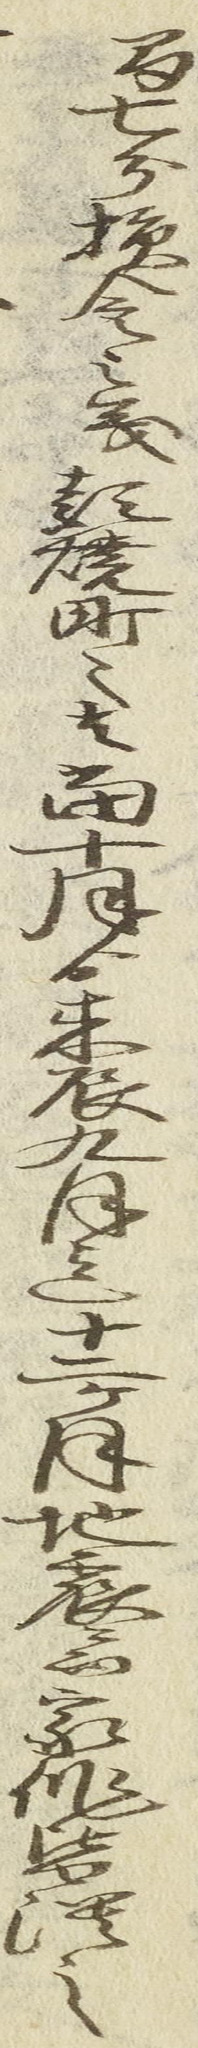間七分損金之義類焼町々者当十月ゟ来辰九月迄十二ケ月地震ニ而家作皆潰之
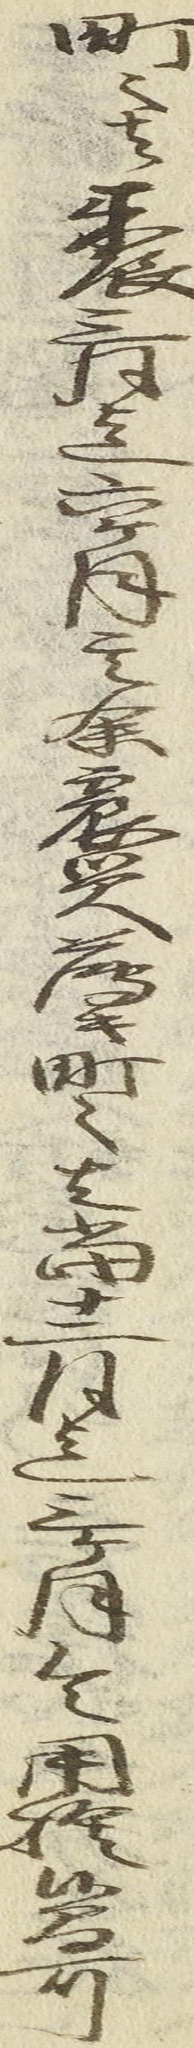町々者来辰三月迄六ケ月其余震災薄キ町々者当十二月迄三ケ月令用捨候間可
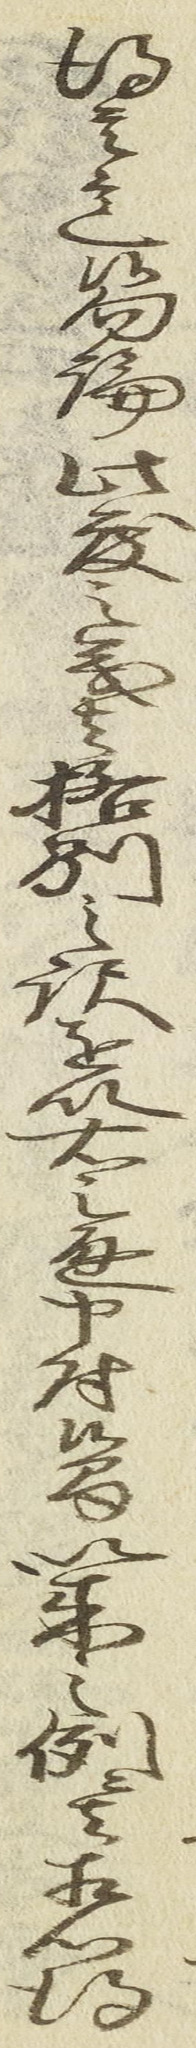得其迄候勿論此度之義者格別之訳を以右之通申付候間以来之例ニ者相心得
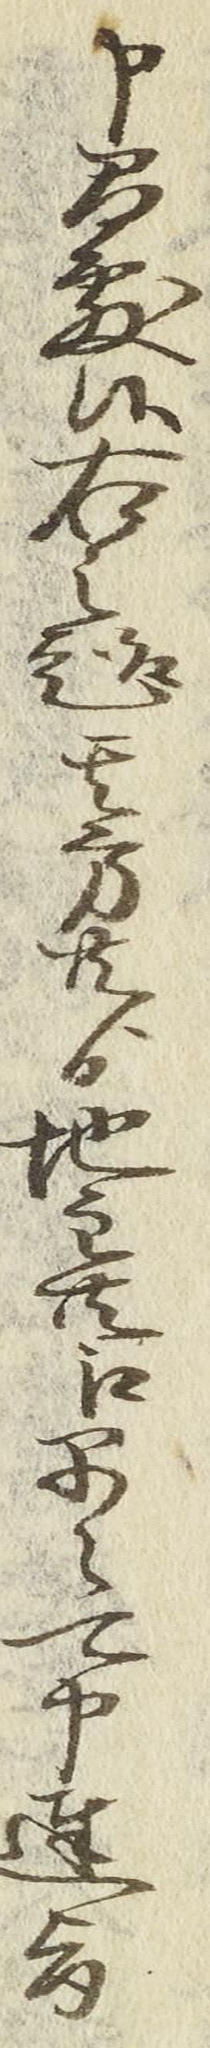申間敷候右之趣其方共ゟ地主共江早々可申達旨
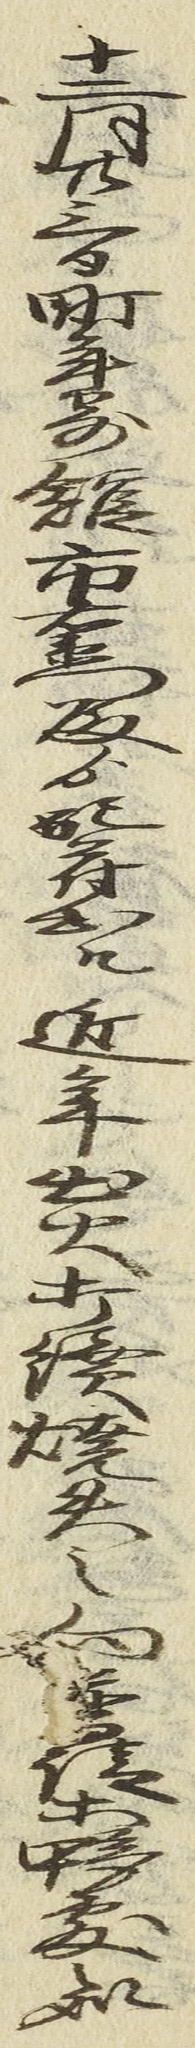一十二月廿三日町年寄舘市右衛門殿ゟ配符出ル近年出火打続焼失之向普請等夥敷候処
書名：安政二年震災記事　完
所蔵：東京大学地震研究所図書室 Earthquake Research Institute Library, The University of Tokyo, JAPAN
